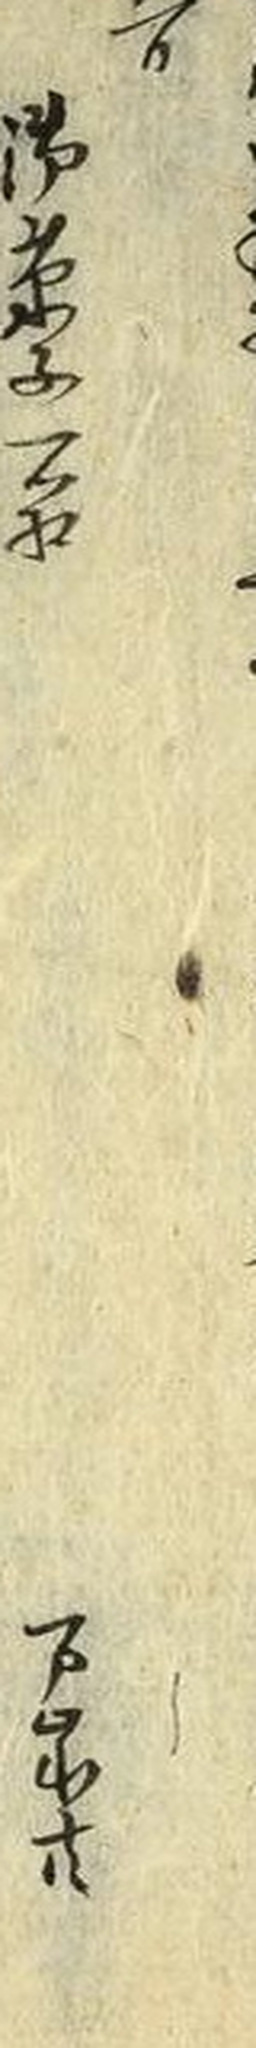御菓子一箱万歳共
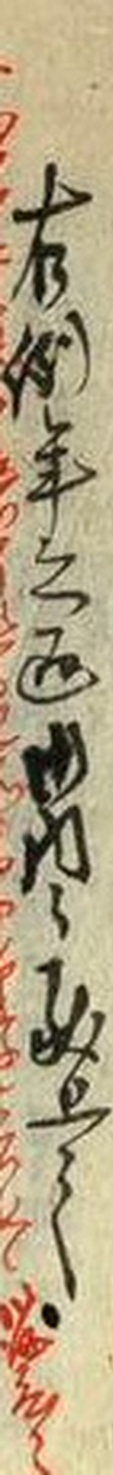右例年之通御内々献上之
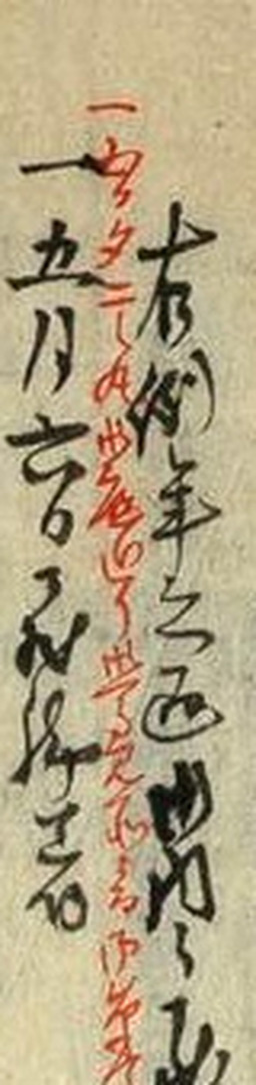一五月六日飛脚着
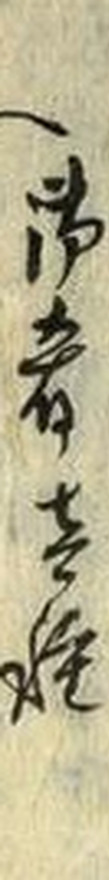御肴壱種
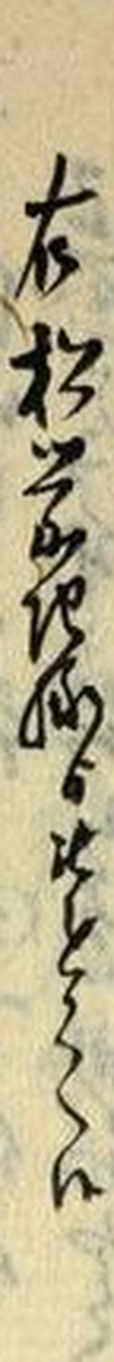右松栄院様ゟ被進之候
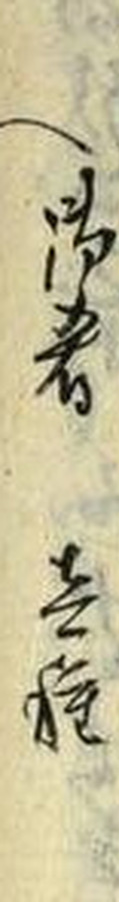御肴壱種
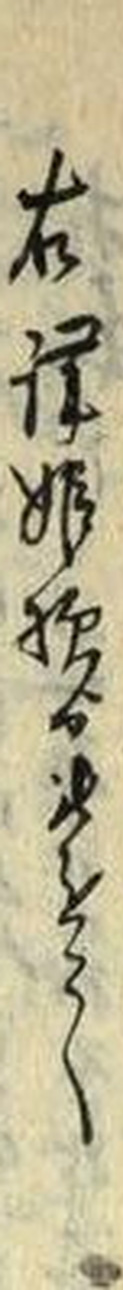右謹姫様ゟ被進之
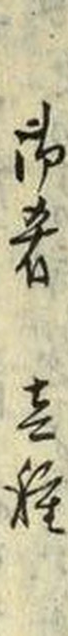御肴壱種
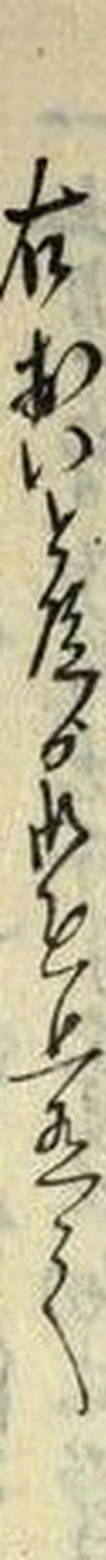右おいと殿ゟ御進上有之
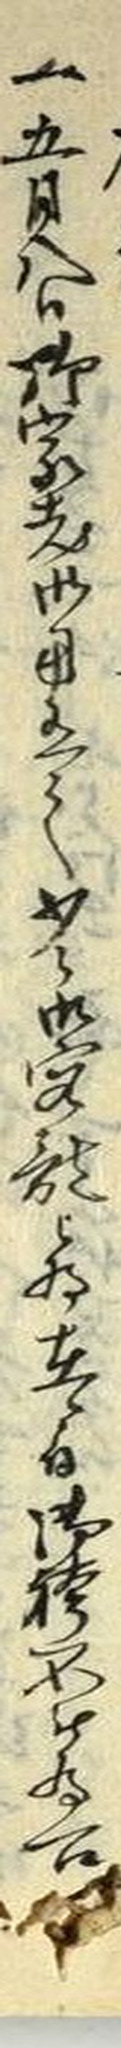一五月八日御家老御用有之少々御容體被為候ニ付御袴不被為召
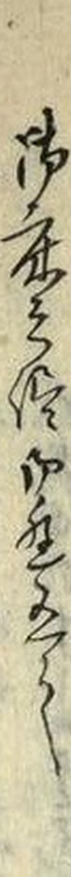御床之儘御逢有之
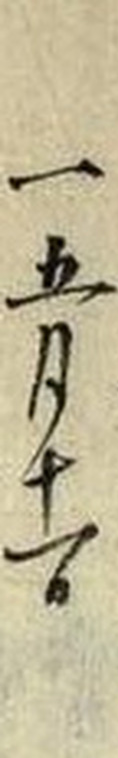一五月十一日
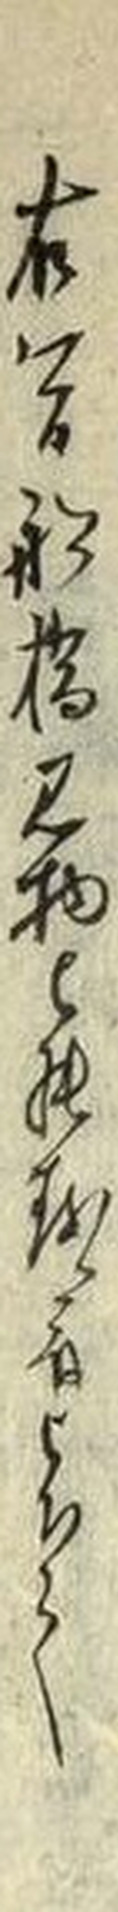右今日船橋見物被罷越候ニ付被下之
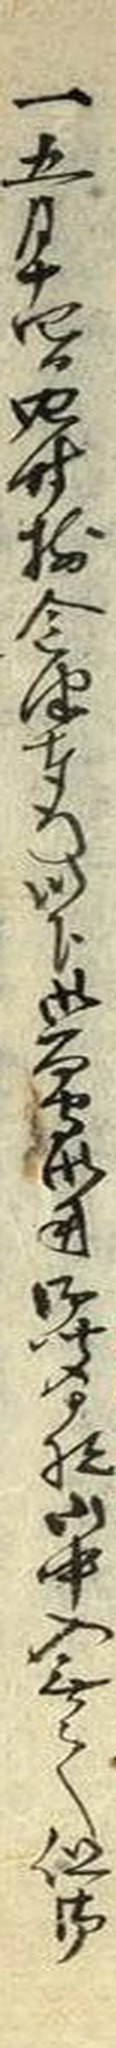一五月十四日四時揃金津奉行以下御留守御用御聞被遊御中入無之但御
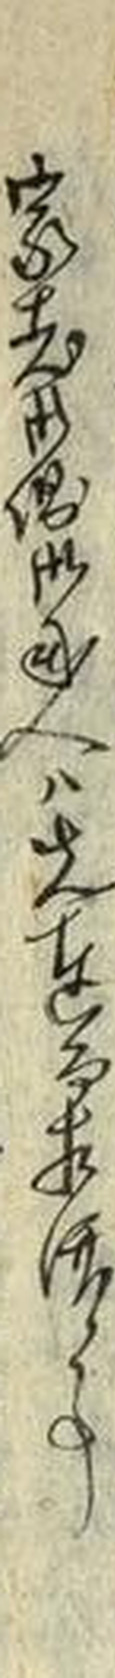家老御側御用人ハ先達而相済候事
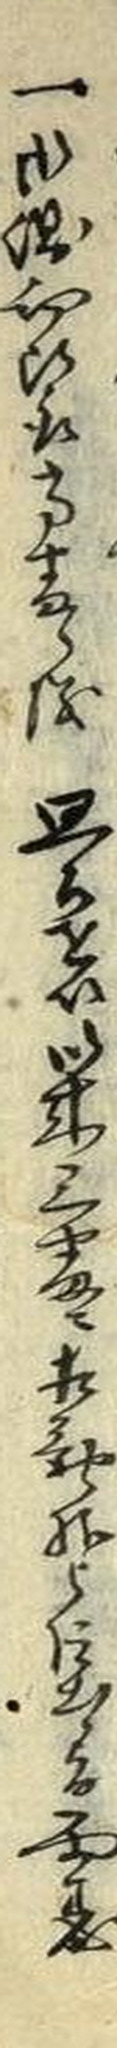一御側向頭取当番之儀思召を以以来三番ニ相勤候様被仰出候旨雨森
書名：少傅日録抄（斉善付側向頭取日記、江戸并道中、初入在国、逝去後…
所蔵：福井県文書館 Fukui Prefectural Archives
